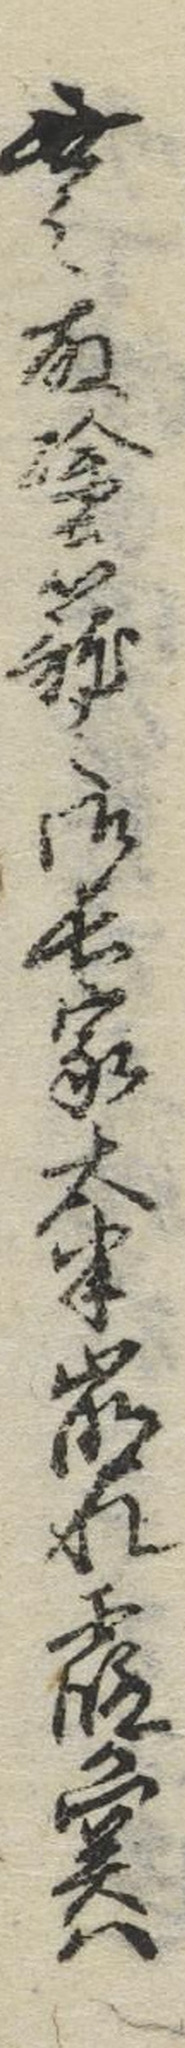無之故塗籠之御長家大半崩れ霞か関ハ
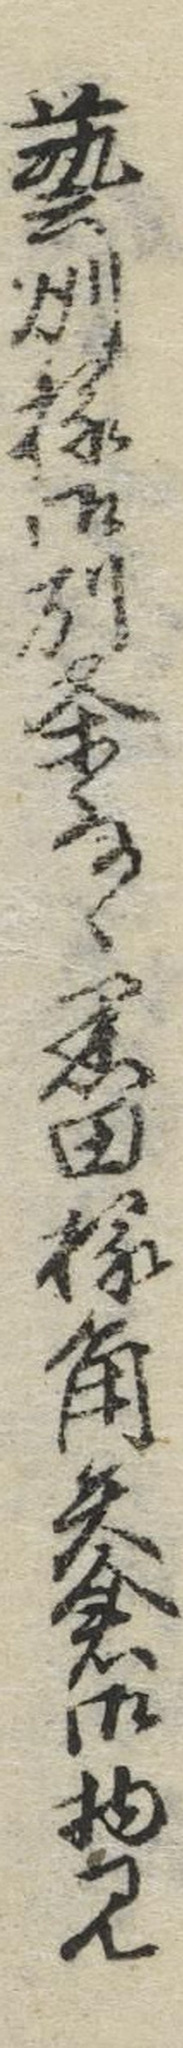芸州様御別条なく黒田様角矢倉御物見
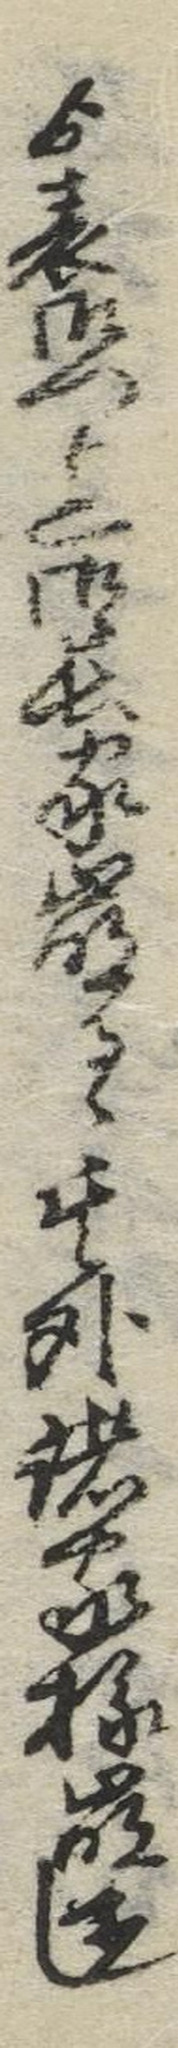ゟ表御門迄御長家崩るゝ其外諸家様崩多し
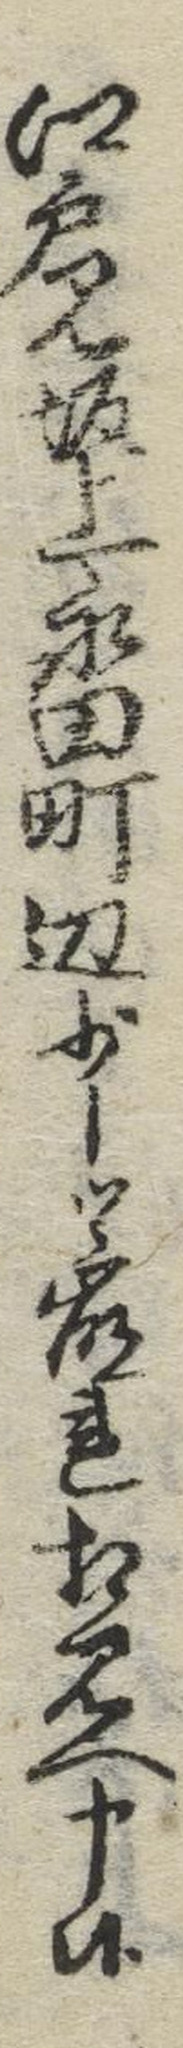江戸見坂上永田町辺少しツヽ崩れ相見へ申候
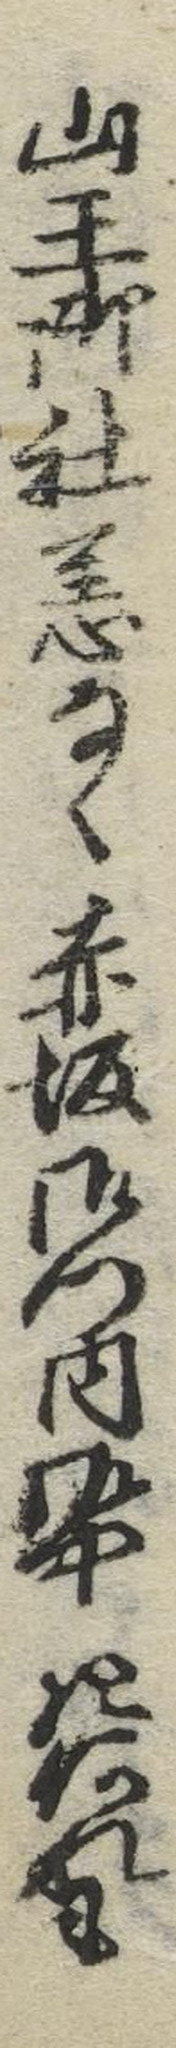山王御社恙なく赤坂御門内御やしき何れも
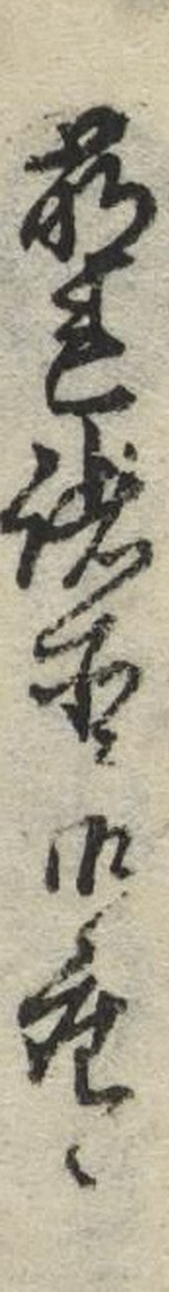崩れ諸所ニ御座候

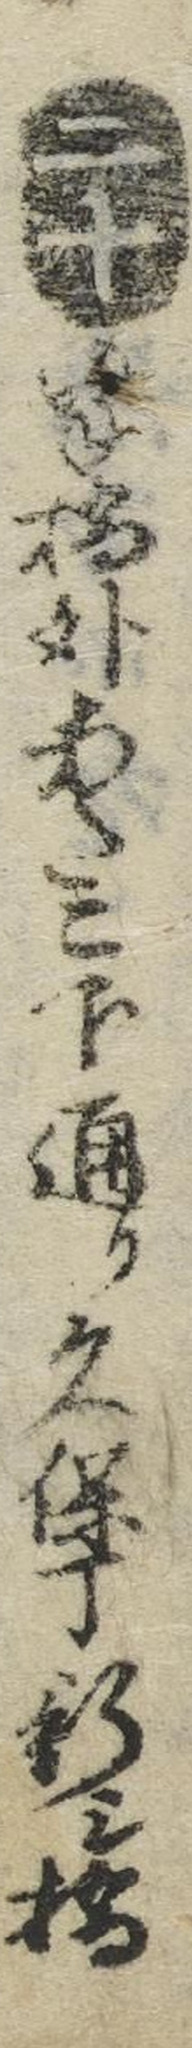二十幸橋外あたこ下通り久保丁新シ橋
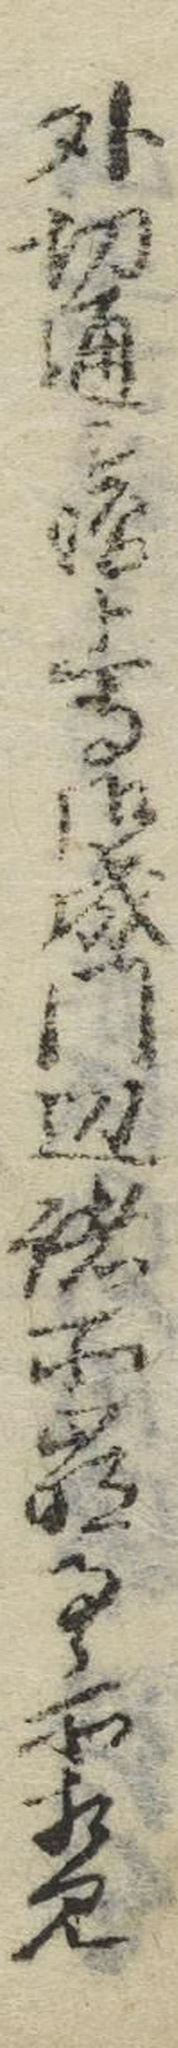外切通シ増上寺御成門辺諸所崩るゝ所相見
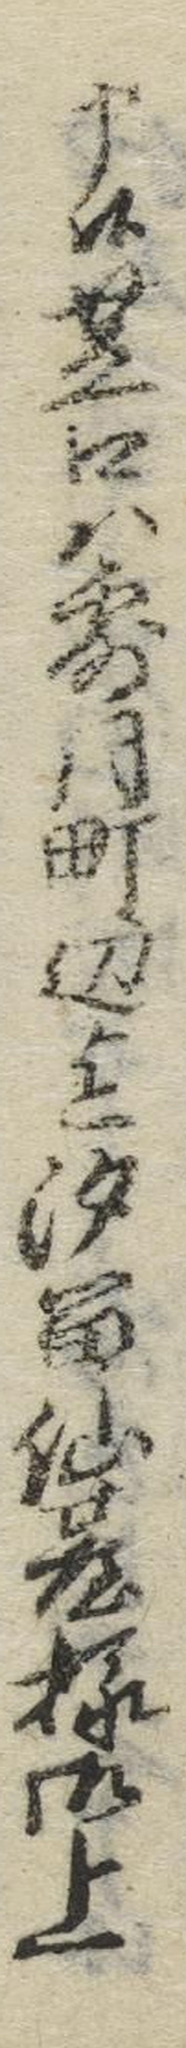申候芝口ハ露月町辺迄汐留仙台様御上
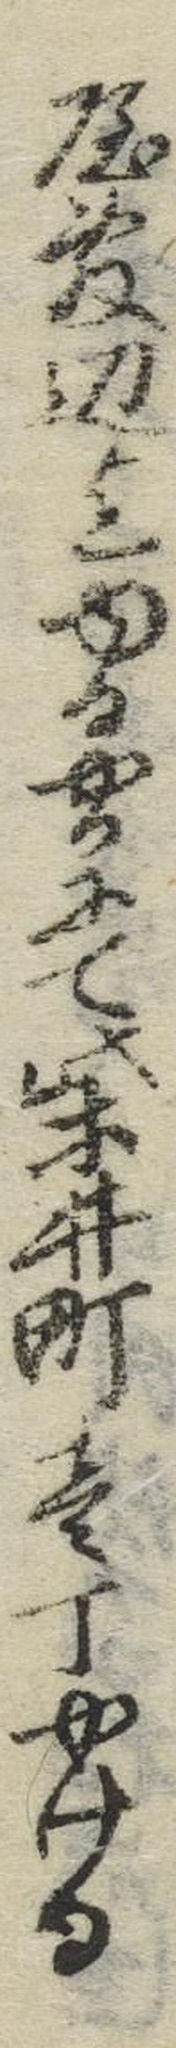屋敷辺迄ゆるやかにて柴井町壱丁やける
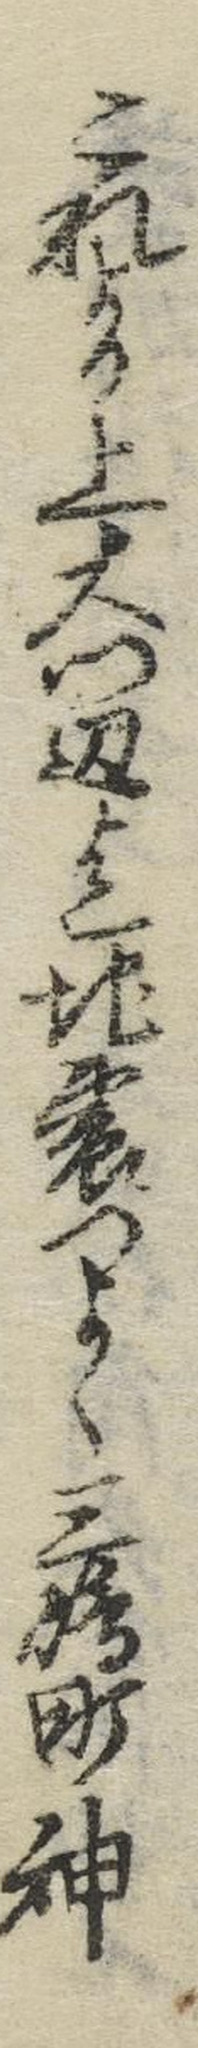これより上大門辺迄地震つよく三嶋町神
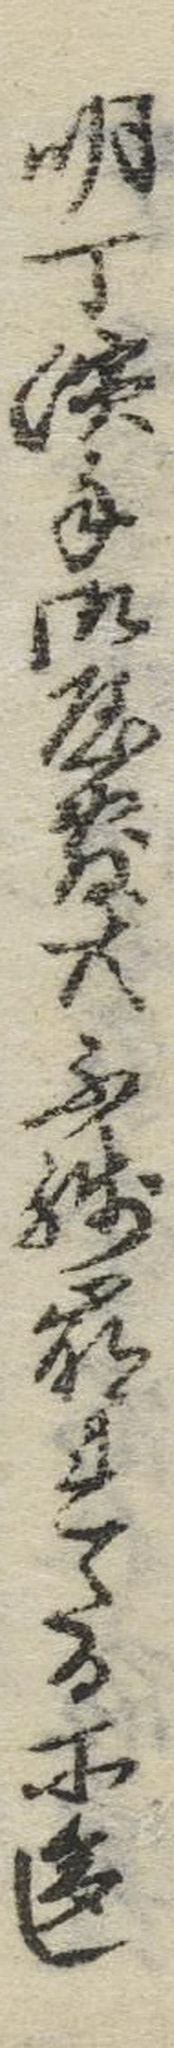明丁濱手御屋敷共不残崩れたる所多し
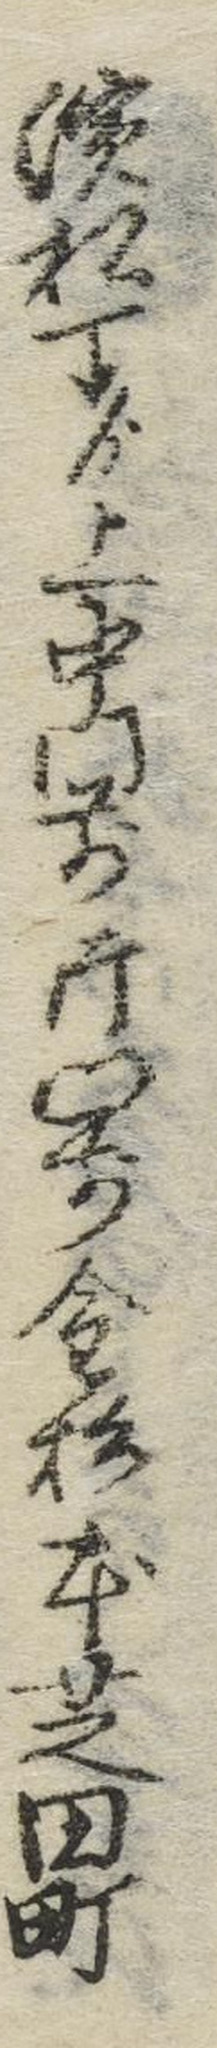濱松丁ゟ上中門前片門前金杉本芝田町
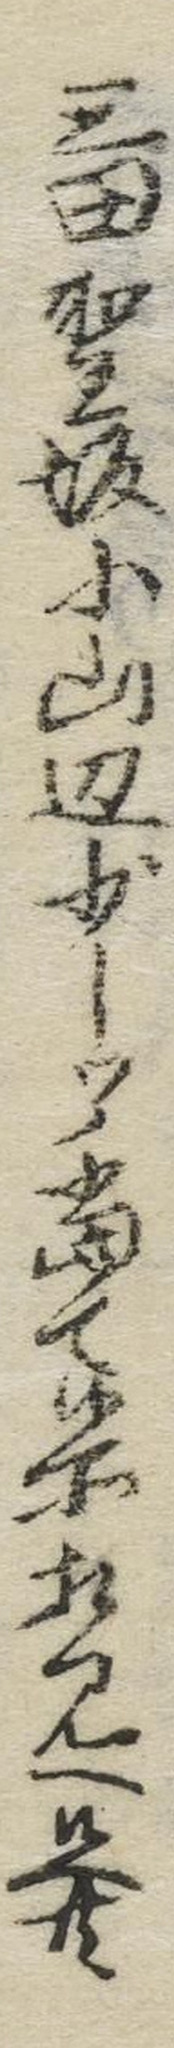三田聖坂小山辺少しツヽ当て候所相見へ候へ共
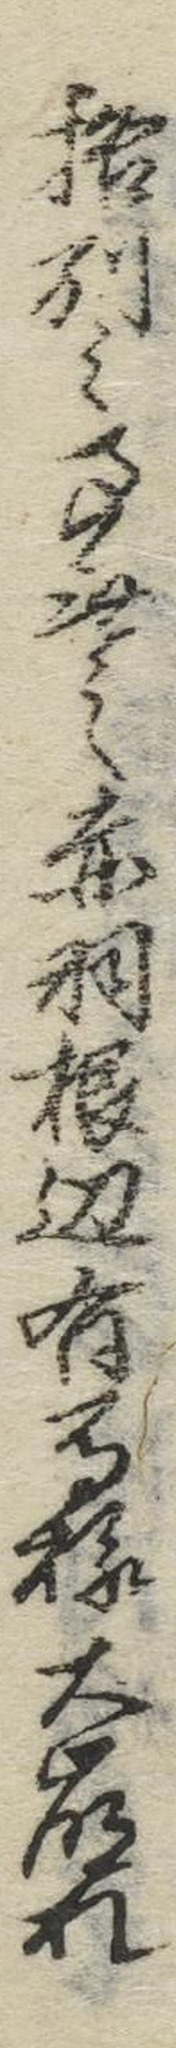格別之事無之赤羽根辺有馬様大崩れ
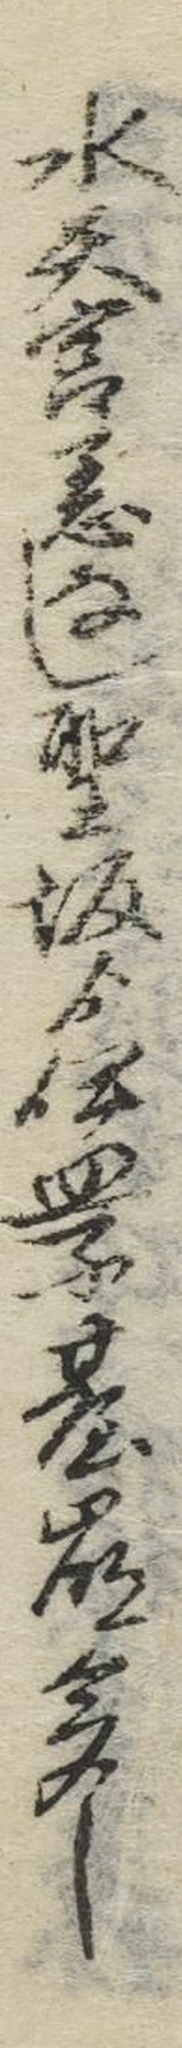水天宮恙なし聖坂ゟ伊皿子台崩多し
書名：江戸御屋鋪方町方共　地震類焼場所巨細書之寫　潰家潰土蔵共取調附街道筋近在迄
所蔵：東京大学地震研究所図書室 Earthquake Research Institute Library, The University of Tokyo, JAPAN
